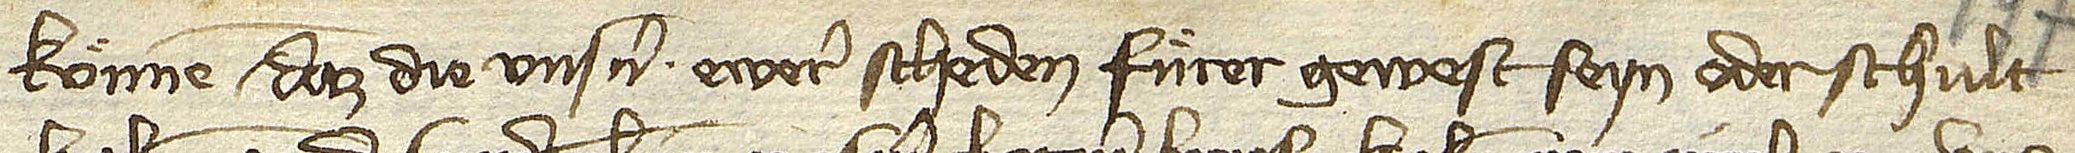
könne* / daʒ die vnſ*n . ewer* ſcheden fürer geweſt ſeyn oder ſchult
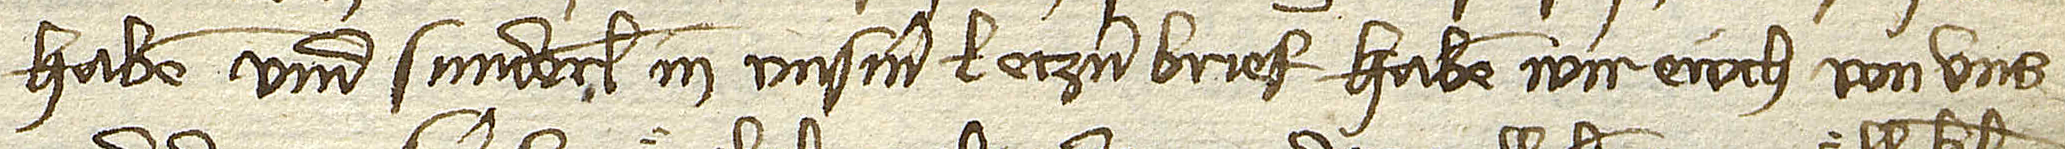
habe* vnd ſunderl* in vnſ*m lecʒ*n brief habe* wir ewch von vns
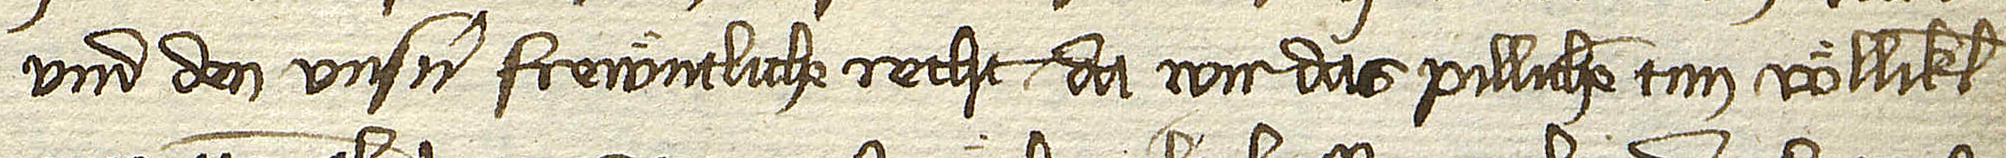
vnd den vnſ*n frewntliche recht / da wir das pilliche* tun völlikl*
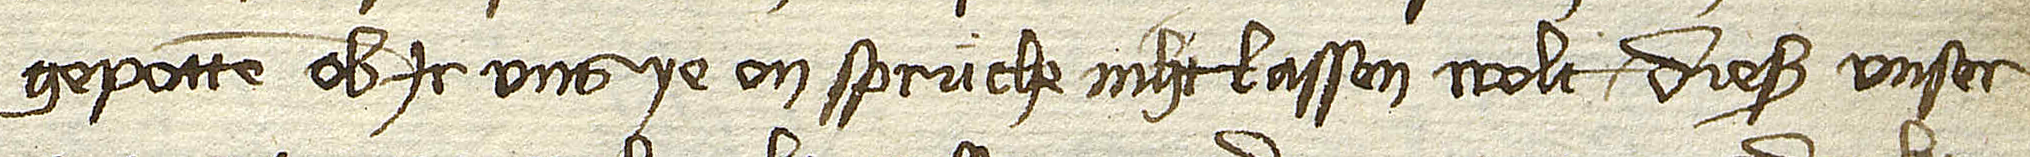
gepotte* ob Ir vns ye on ſprüche niht laſſen wolt / Dieſ* vnſer
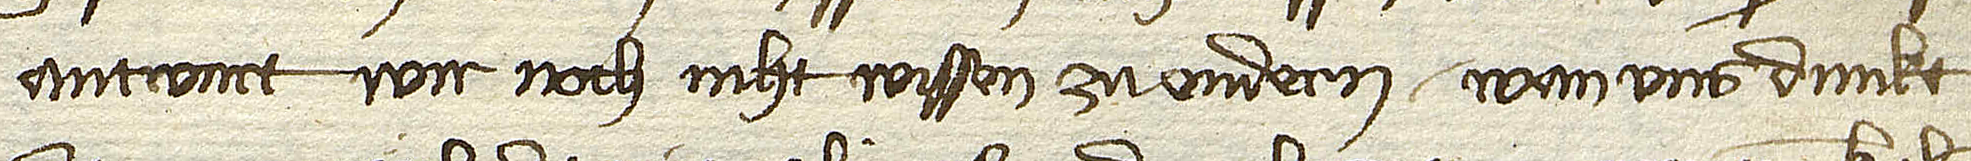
antwurt wir noch niht wiſſen ʒu endern / wan vns dunkt
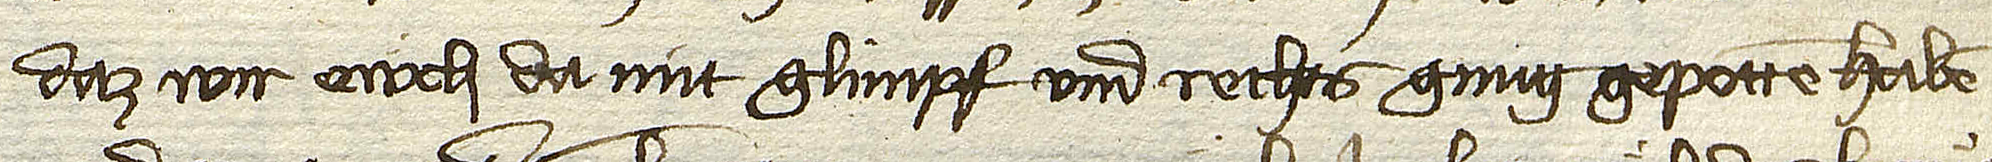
daʒ wir ewch da mit glimpf vnd rechts gnug gepotte* habe*
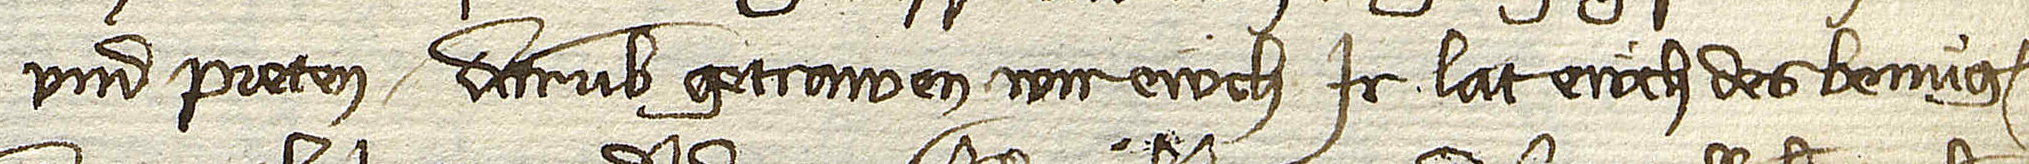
vnd pieten / Daru*b getrawen wir ewch Ir . lat ewch des benüg*
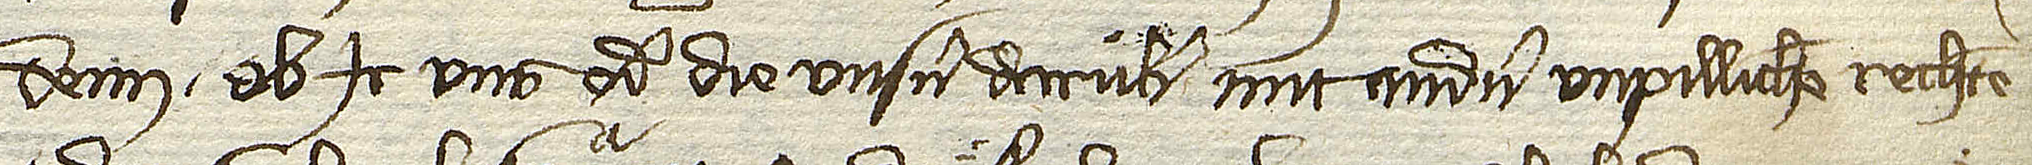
Denn / ob Ir vns od* die vnſ*n darüb* mit and*n vnpilliche* rechte*
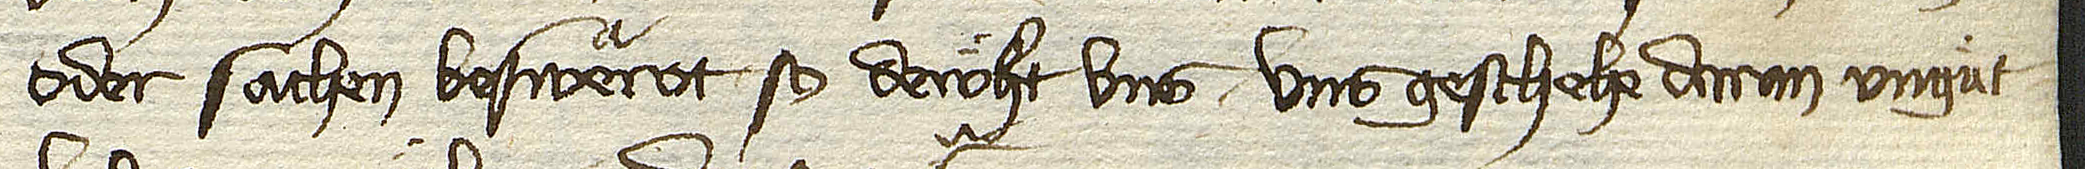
oder ſachen beſwërot ſo dewcht vns / Vns geſchehe daran vngüt =
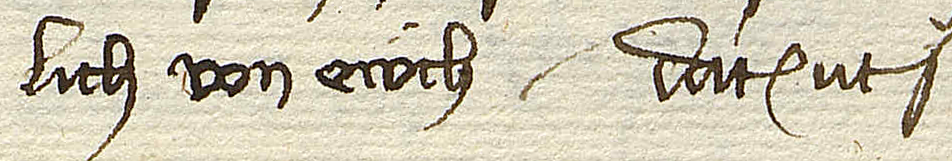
lich von ewch / Dat* ut ſ*
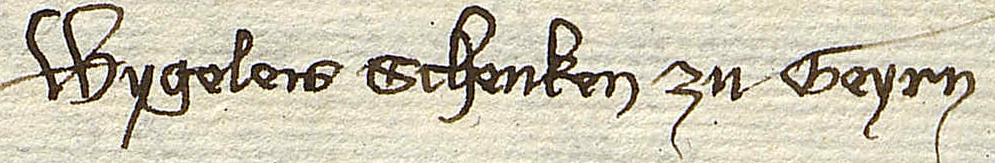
Wygeleis Schenken ʒu Geyrn
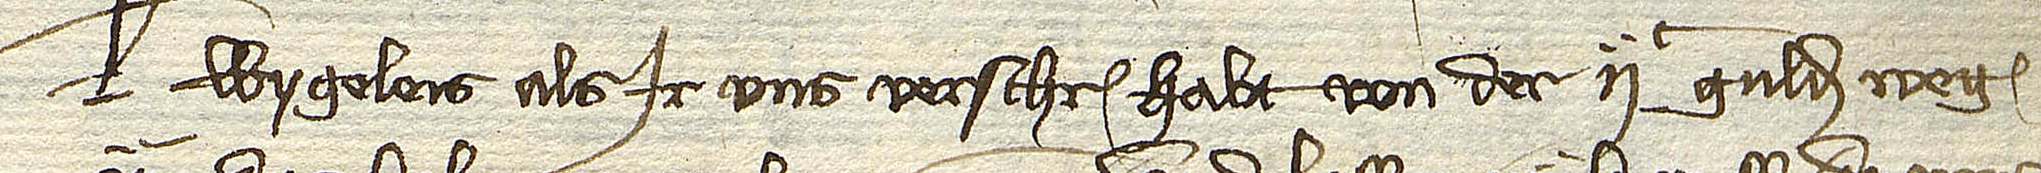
L* Wygeleis als Ir vns verſchr* habt von der ii* guld* weg*
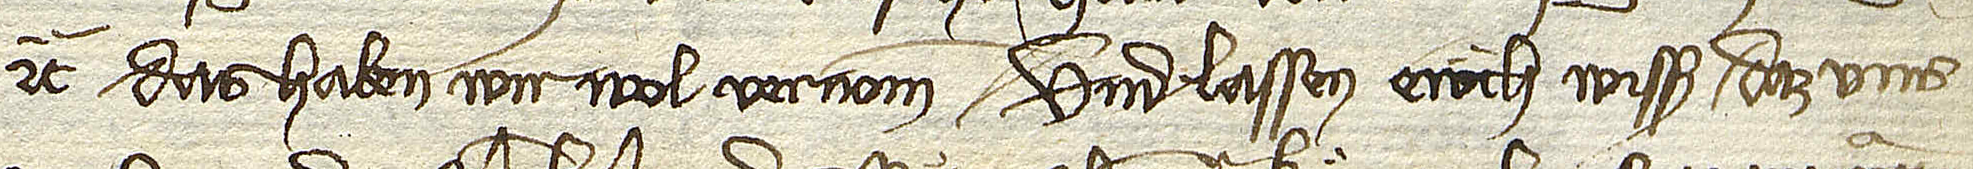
ec* / das haben wir wol vernom* / Vnd laſſen ewch wiſſ* / daʒ vns
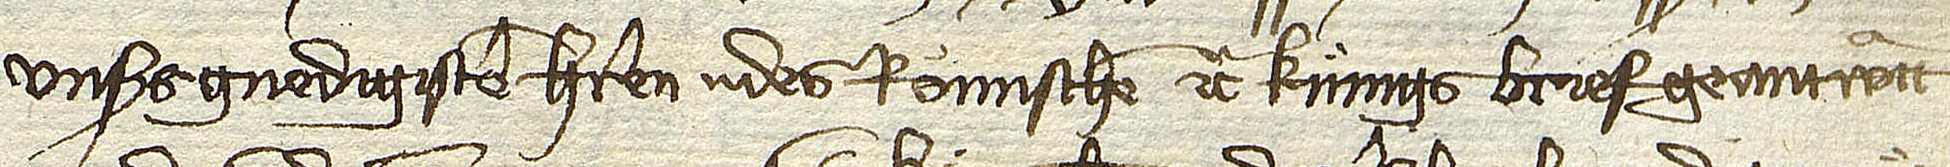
vnſ*s gnedigiſte* h*ren ~ des Römiſche* ec* künigs brief geantw*tt
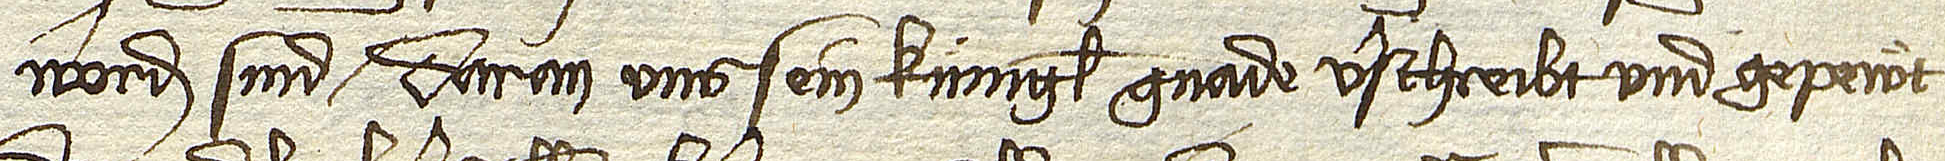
word* ſind / Daran vns ſein künigl* gnade v*ſchreibt vnd gepewt
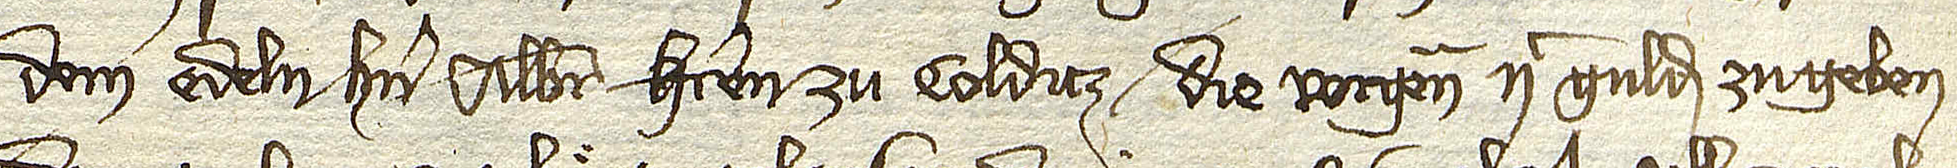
dem edeln h*n Albr* h*ren ʒu Coldicʒ / die vorgen* ii* guld* ʒu geben
